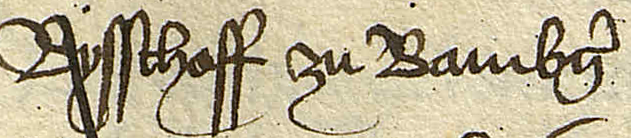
Byſſchoff cʒu Bambg*
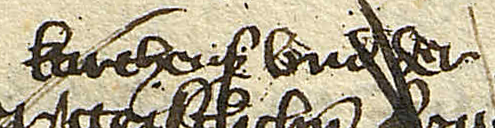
Kartheuſ* vnd der
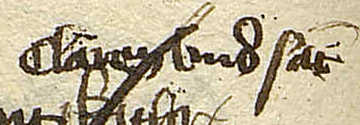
Claren vnd ſat*
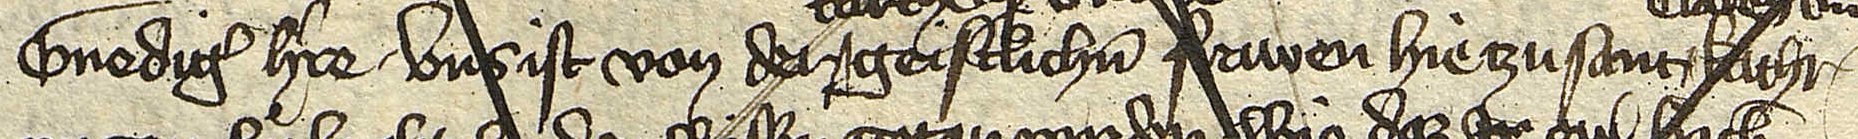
Gnedig* h*re / Vns iſt von der geiſtlichn* frawen hie cʒu ſant Kathr*
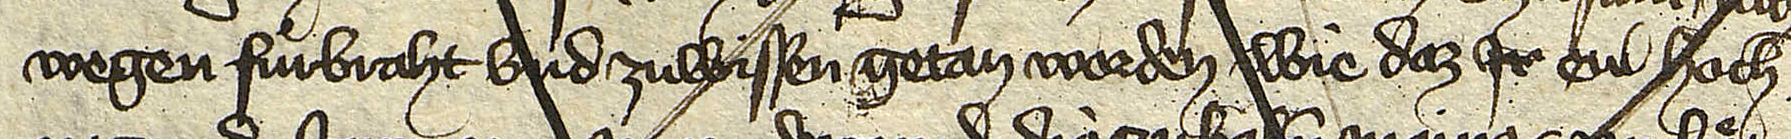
wegen fürbraht vnd cʒuwiſſen getan worden / wie daʒ Ir ew* hoch*
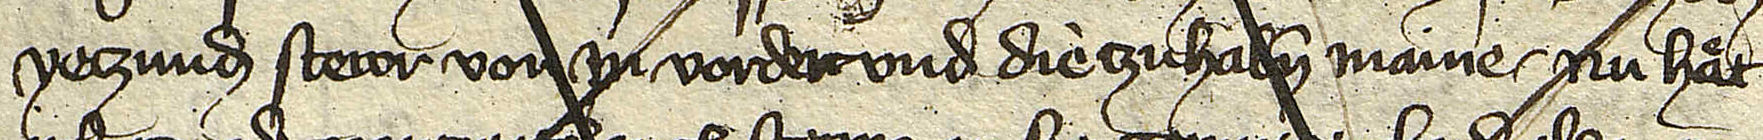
yecʒund* ſtewr von In vorder vnd die cʒuhabn* maine / Nu hät
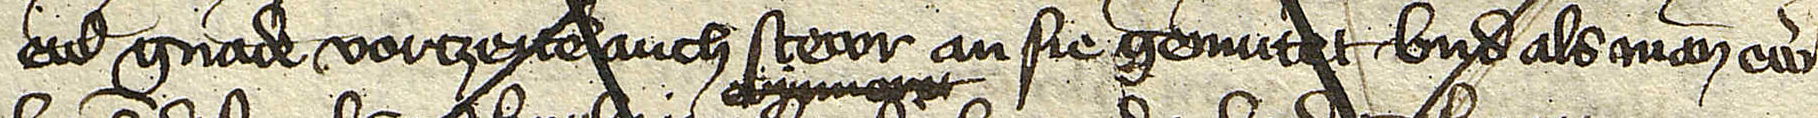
ew* gnade vorcʒeite* auch ſtewr an ſie gemutet / vnd als man ew*
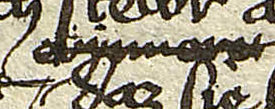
erynneret
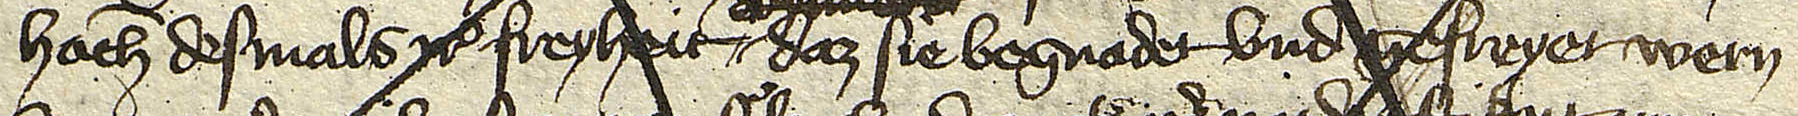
hoch* deſmals ir* freyheit / daʒ ſie begnadet vnd gefreyet wern
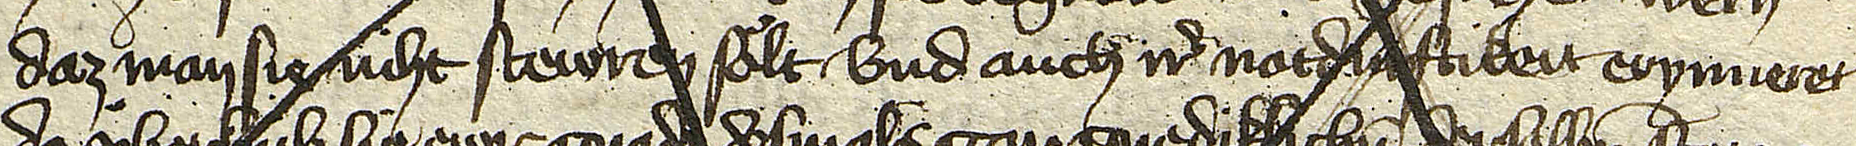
daʒ man ſie niht ſtewren ſölt / vnd auch ir* notdurftikeit erynneret
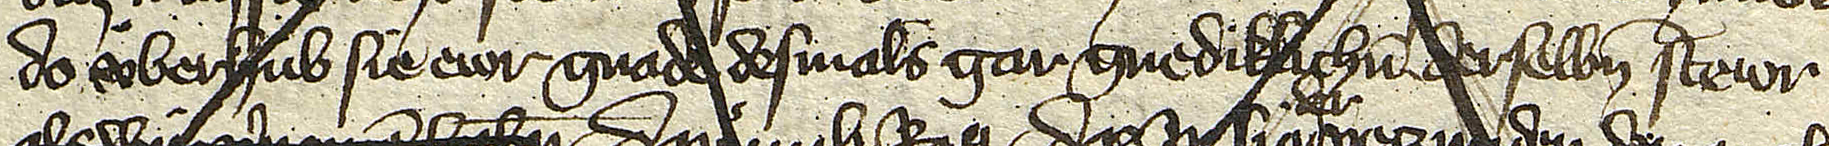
do v̈berhub ſie ewr gnade deſmals gar gnediklichn* derſelbn* ſtewr
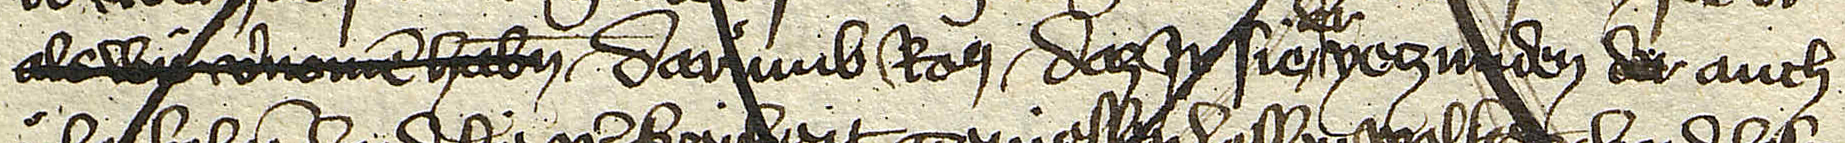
als wir v*nome* habn* / Darümb Ro* / daʒ Ir ſie yecʒunden der auch
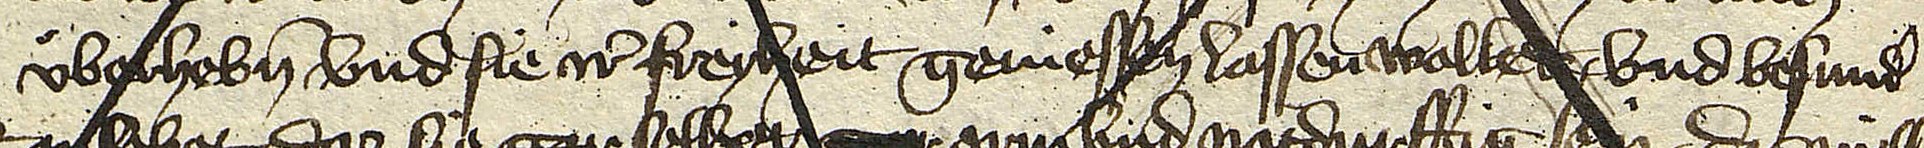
v̈berhebn* / vnd ſie ir* freyheit genieſſen laſſen wollet / vnd beſund*
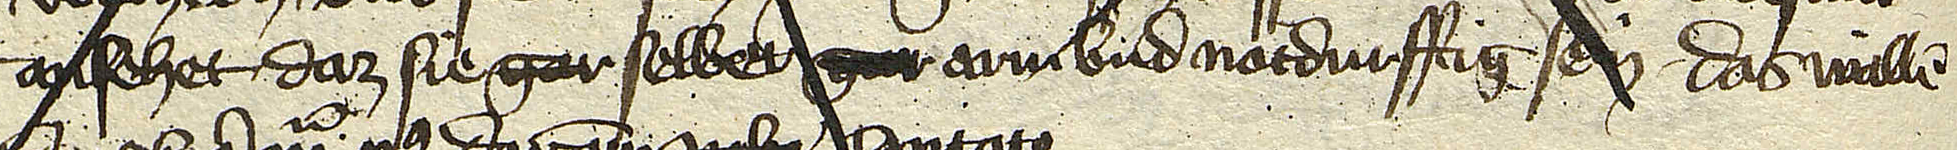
anſehet / daʒ ſie gar ſelber gar arm vnd notdurfftig ſein das wölle*
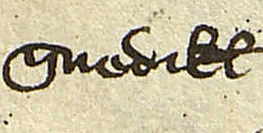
gnedikl*
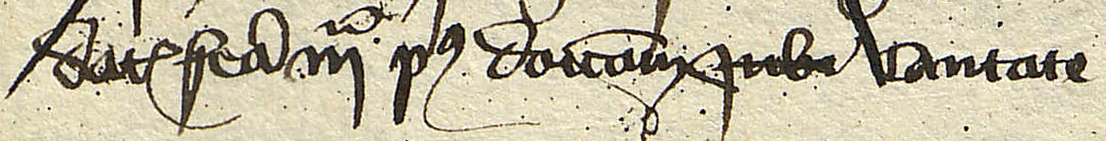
dat* fea* iii* p* doicam* Iubi Cantate
